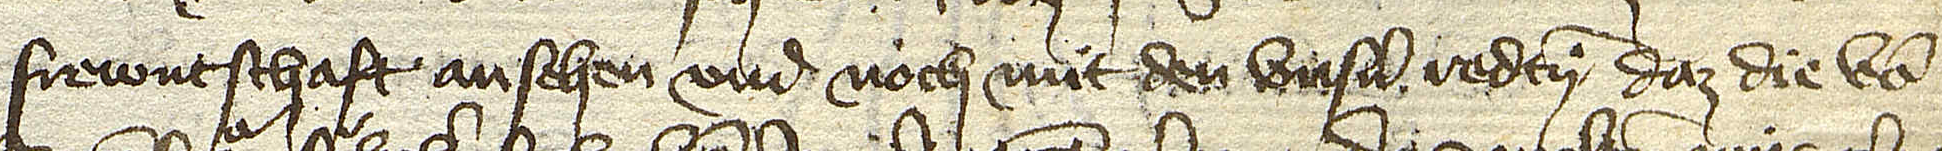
frewntſchaft anſehen vnd noch mit den vnſn* redtn* / daʒ die vo*
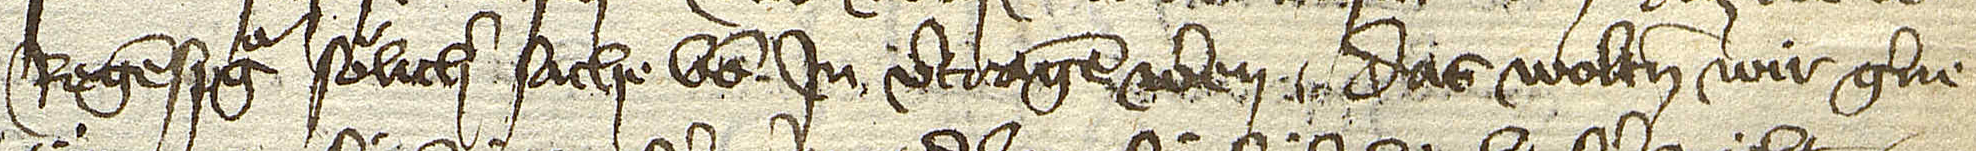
Rege*ſp*g ſölich* ſache vo* In v*trage* w*en / Das woltn* wir g*ne
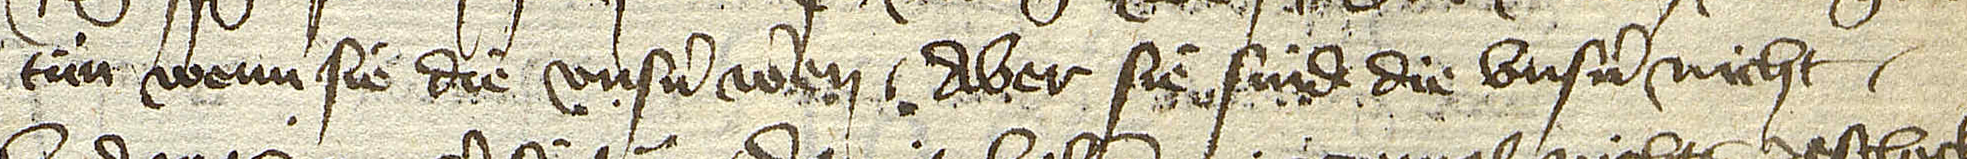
tün wenn ſie die vnſn* w*en / Aber ſie ſind die vnſn* nicht /
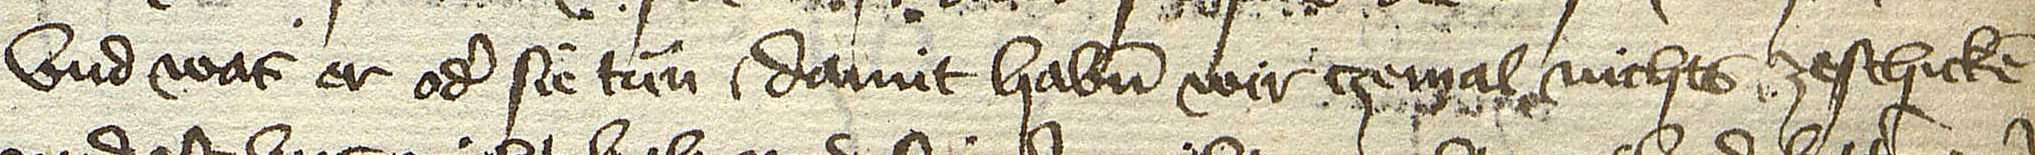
vnd was er od* ſie tün / damit habn* wir cʒemal nichts ʒeſchicke*
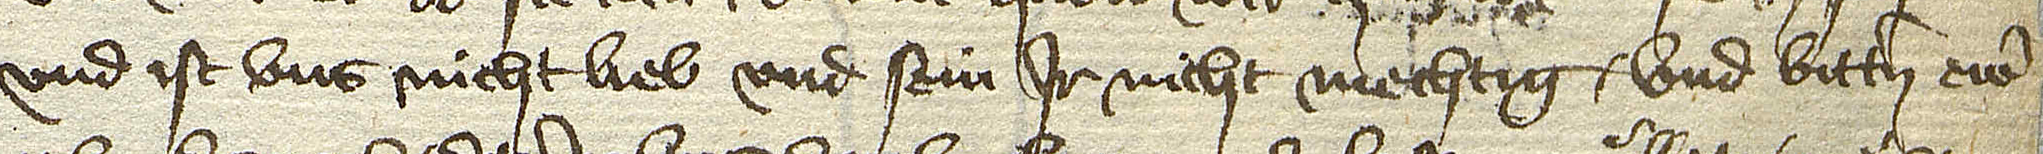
vnd iſt vns nicht lieb vnd ſein Ir nicht mechtig / vnd bittn* ew*
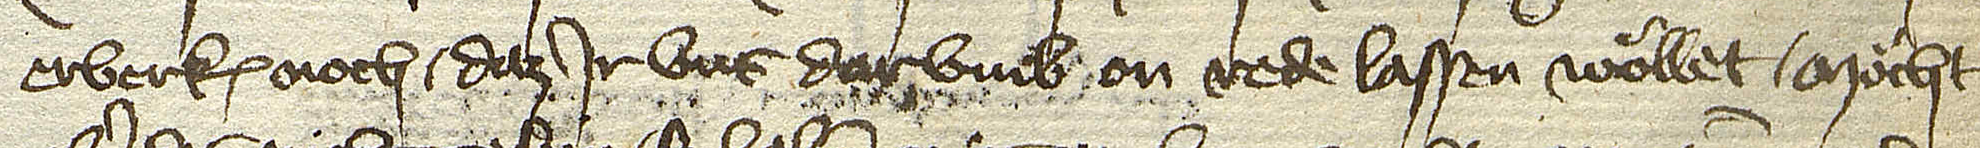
erberk* noch / daʒ Ir vns darvmb on rede laſſen wöllet / Möcht
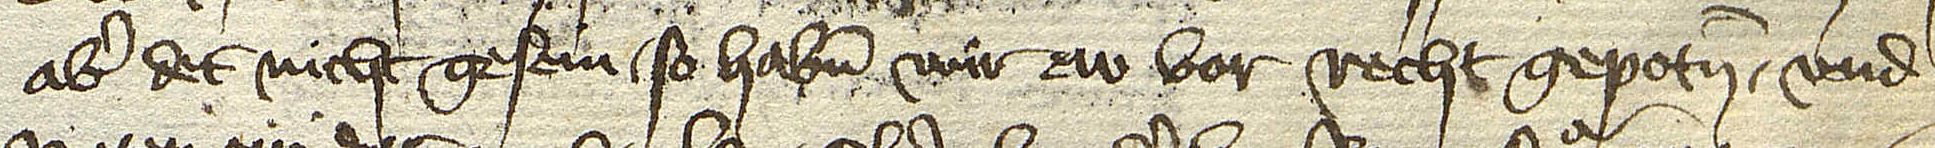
ab* des nicht geſein / ſo habn* wir ew vor recht gepotn* / vnd
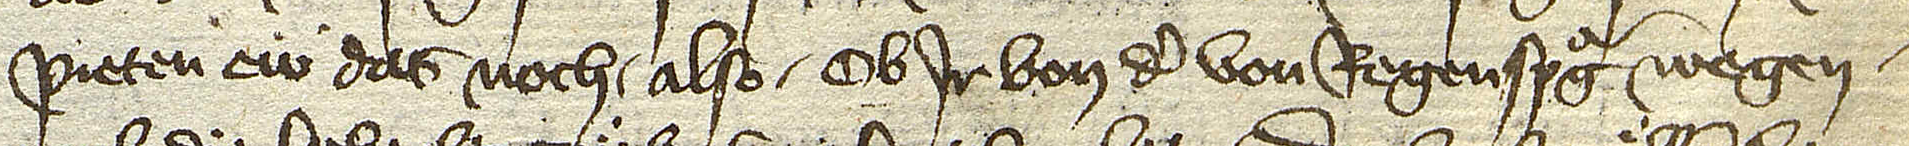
pieten ew das noch / alſo / Ob Ir von d* von Regenſp*g wegen /
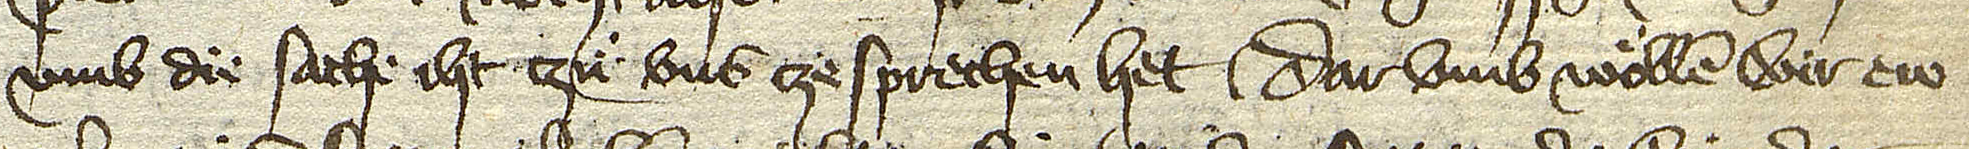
vmb die ſache iht cʒü vns cʒe ſprechen het / Darvmb wölle* wir ew
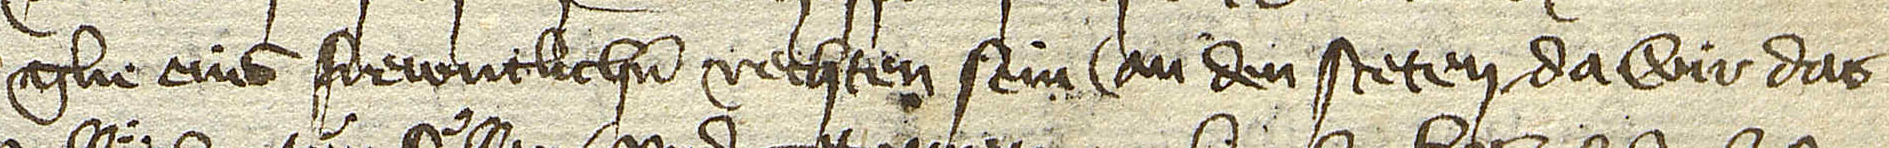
g*ne eins frewntlichn* rechten ſein / an den ſteten / da wir das
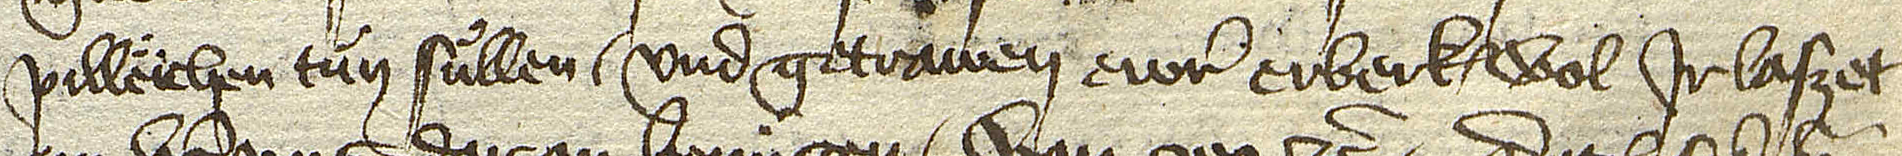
pilleichen tün ſüllen / vnd getrawen ewr* erberk* wol Ir laſʒet
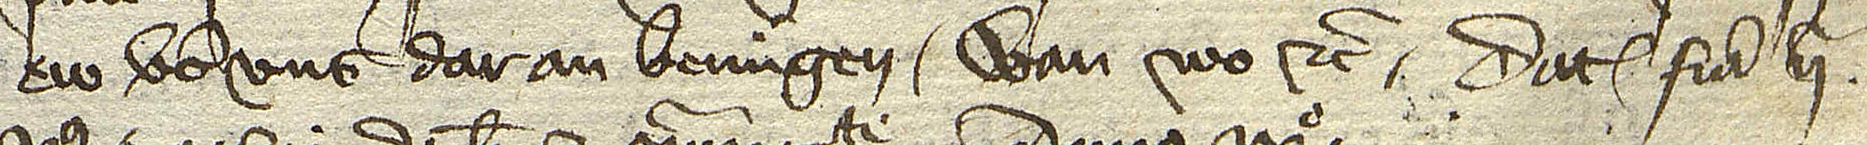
ew vo* vns daran benügen / wan wo ec* / Dat* fia* ii*
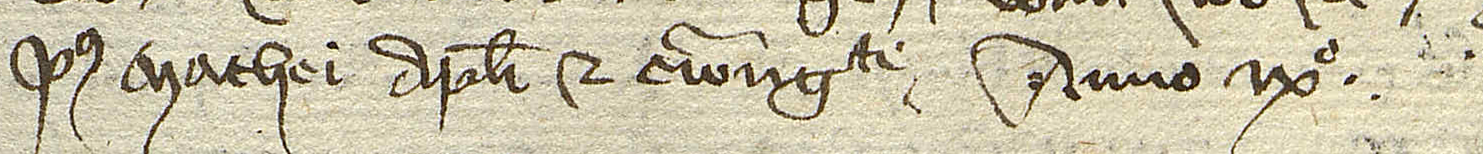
p* Mathei Apli* @ ewng* / Anno ix* .
